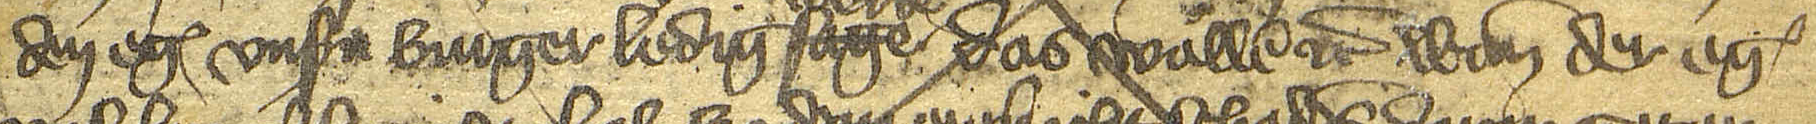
den eg* vnſ*n burger ledig ſage / das wölle* ec* / wan* der eg*
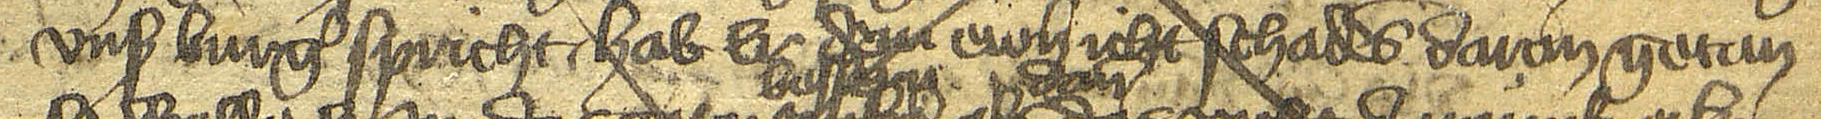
vnſ* burg* ſpricht / hab Er dem ewn* icht ſchades* daran getan
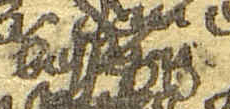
beſſern
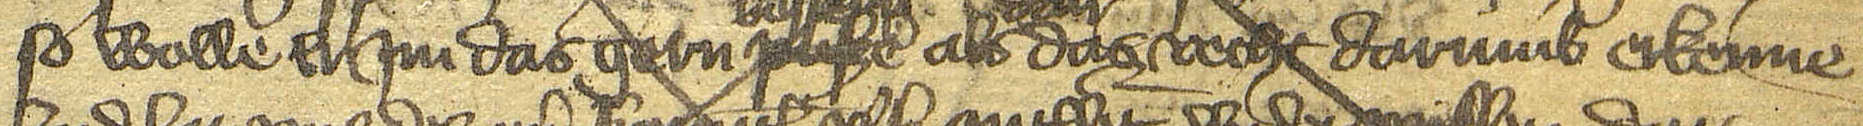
ſo wolle Er Im das gern püſʒe* als das recht darümb erkenne
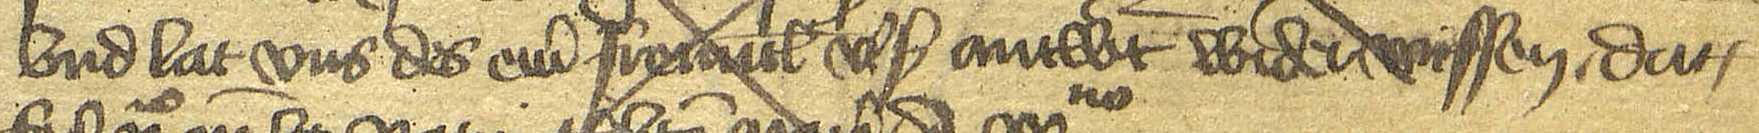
vnd lat vns des ew* freuntl* v*ſ* antw*t wider wiſſen / dat*
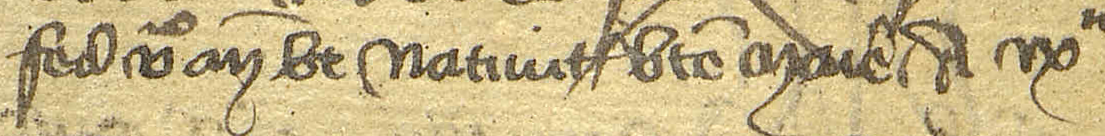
fea* x* an* bt Natiuit* bte* Maie* / A ix*
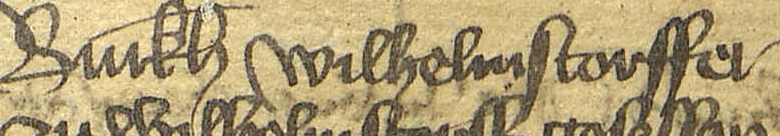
Burkh* Wilhelmſtorffer
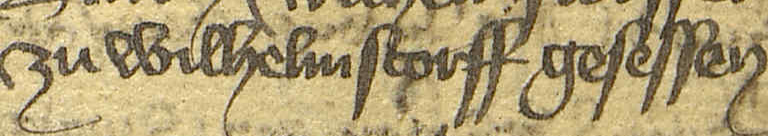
cʒu Wilhelmſtorff geſeſſen
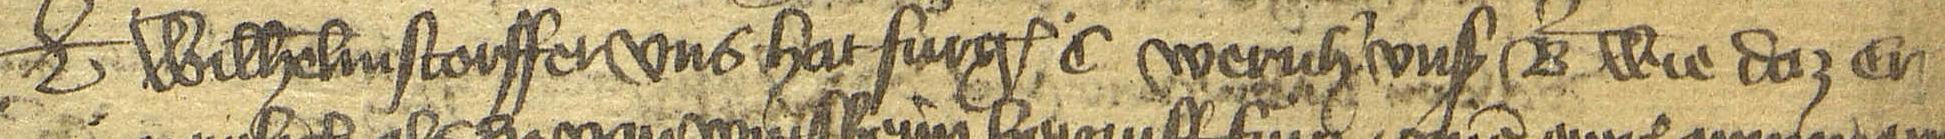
L* Wilhelm*ſtorffer vns hat fürg* C werich* vnſ* B* wie daʒ Er
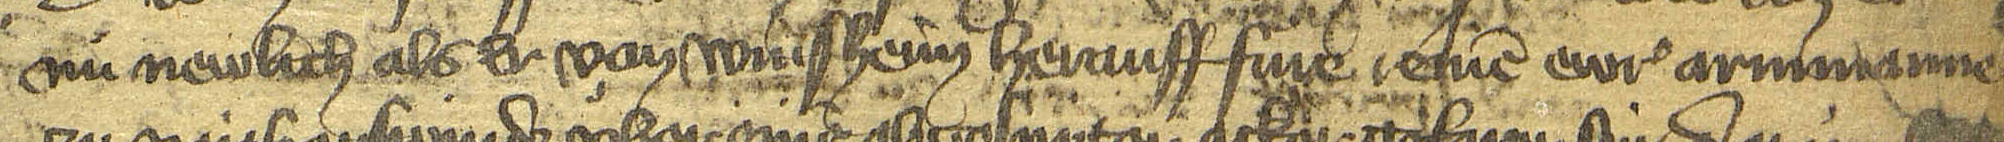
nü newlich als Er von winſheim herauff füre eine* ewr* armmanne
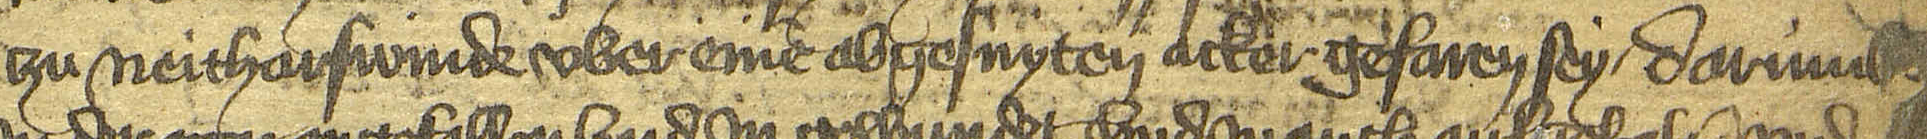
cʒu neitharſwinde v̈ber eine* abgeſnyten acker gefaren ſey / Darümb
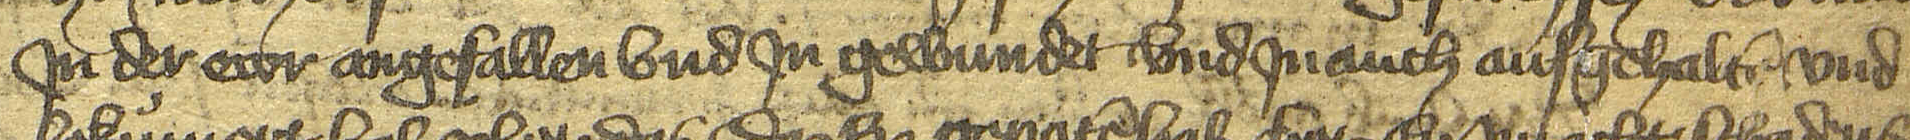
In der ewr angefallen vnd In gewundet / vnd In auch aufgehalte* vnd
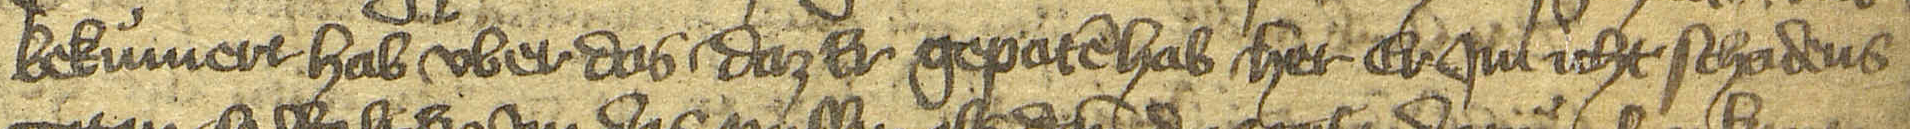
bekümert hab v̈ber das / daʒ Er gepote* hab / het Er Im icht ſchadens
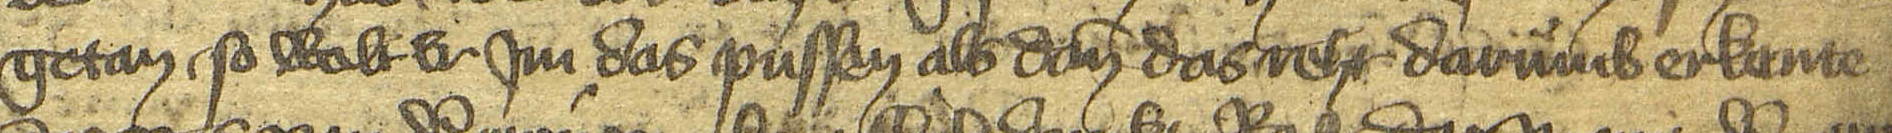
getan / ſo wolt Er Im das puſſen als dan* das reht darümb erkante
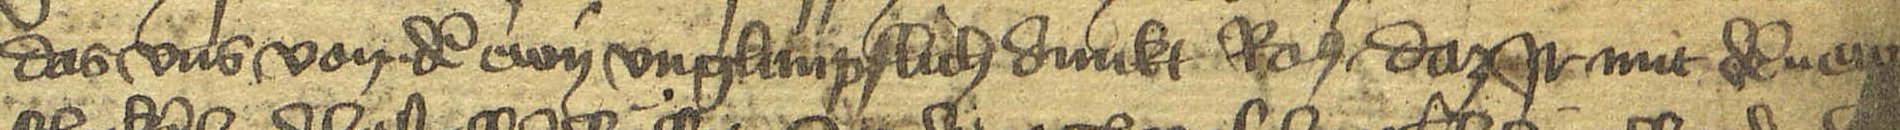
das vns von ~ de* ewn* vnglimpflich dunckt Ro* / daʒ Ir mit de* ~ ew
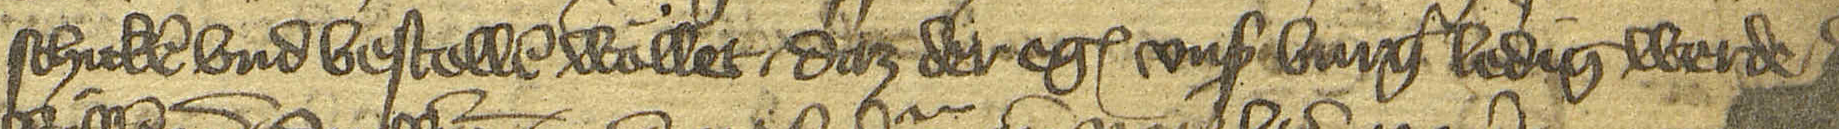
ſchicke* vnd beſtelle* wöllet / daʒ der eg* vnſ* burg* ledig werde / %
